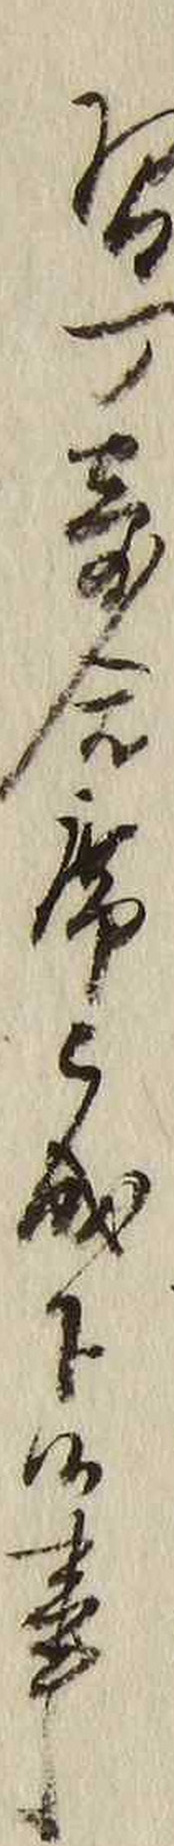習一ノ合席被成下候事
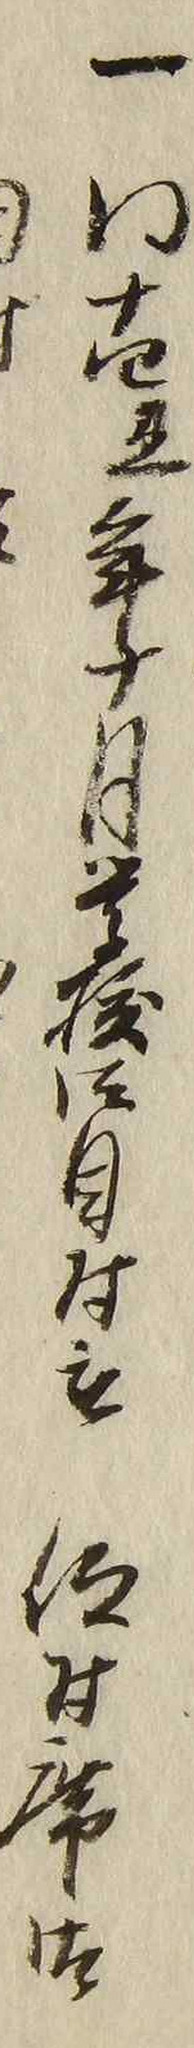一同十四丑年十月学校御目付被仰付席御
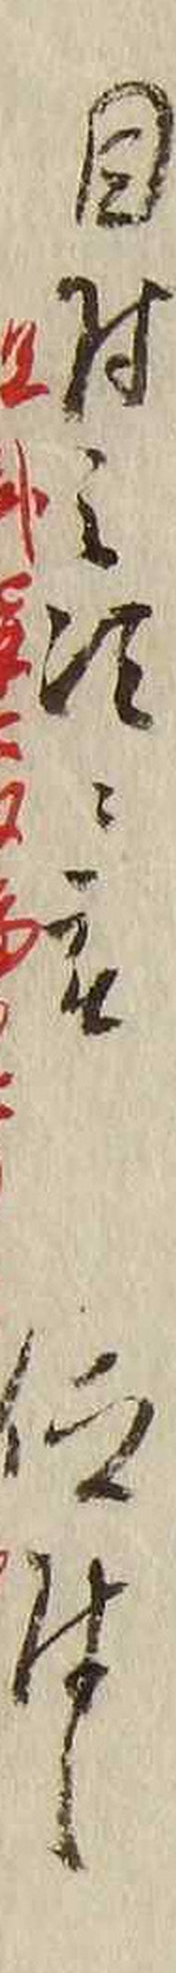目付之次ニ被仰付候
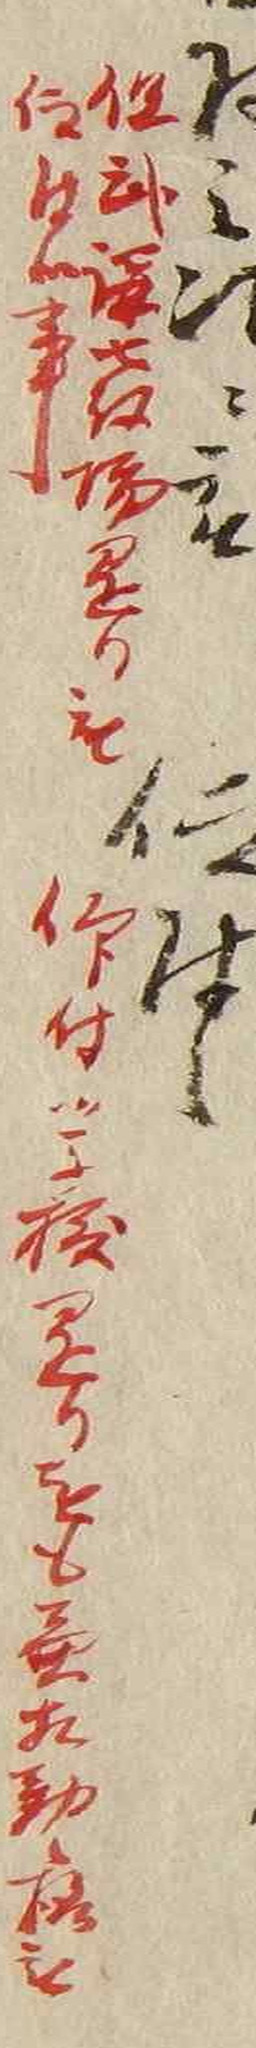但武講教場懸り被仰付学校懸りをも兼相勤候様被

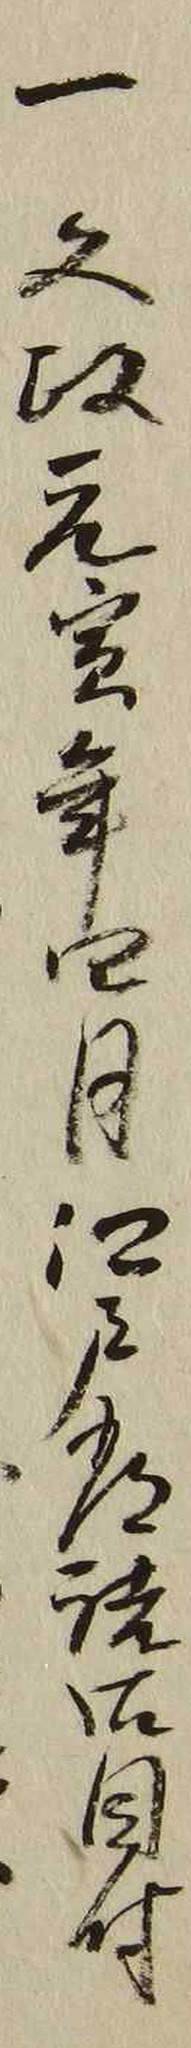一文政元寅年四月江戸常詰御目付
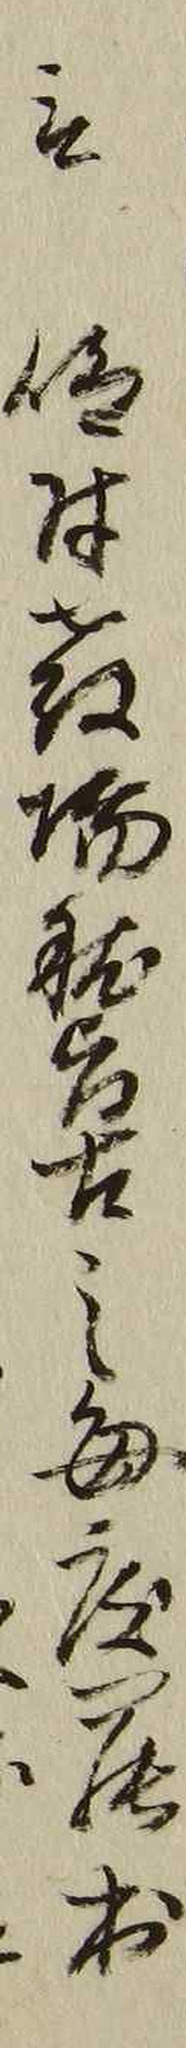被仰付教場稽古之毎度罷出
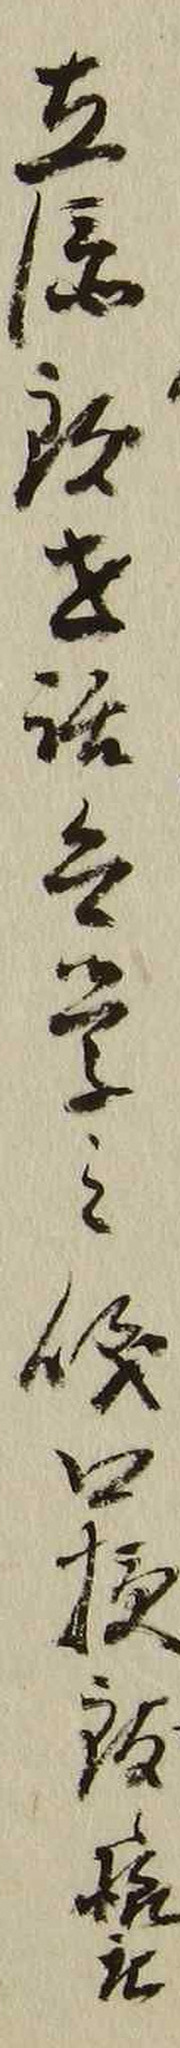立添致世話兵学之儀口授致候様被
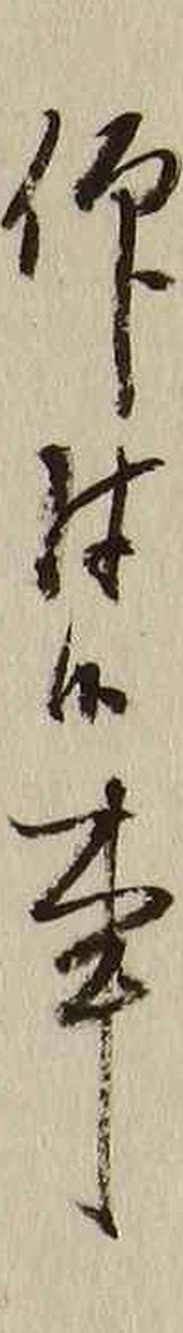仰付候事
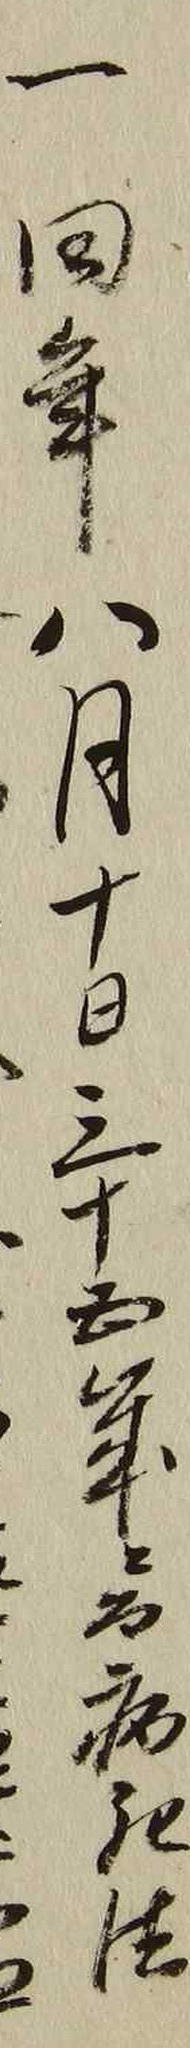一同年八月十日三十五歳ニ而病死法
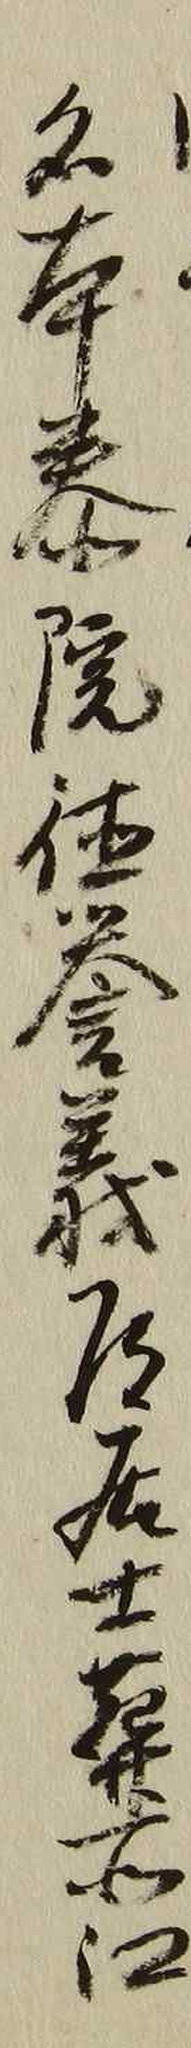名本恭院徳誉義道居士葬所江
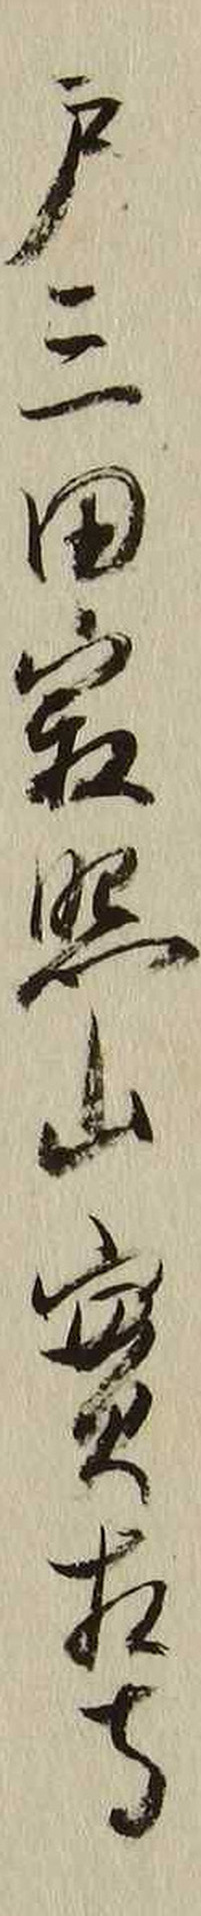戸三田寂照山実相寺
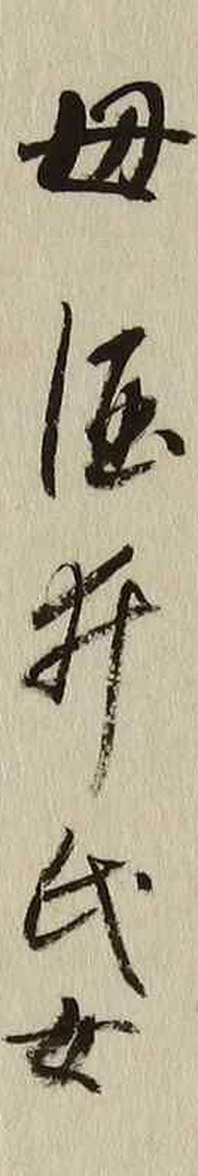母酒井氏女
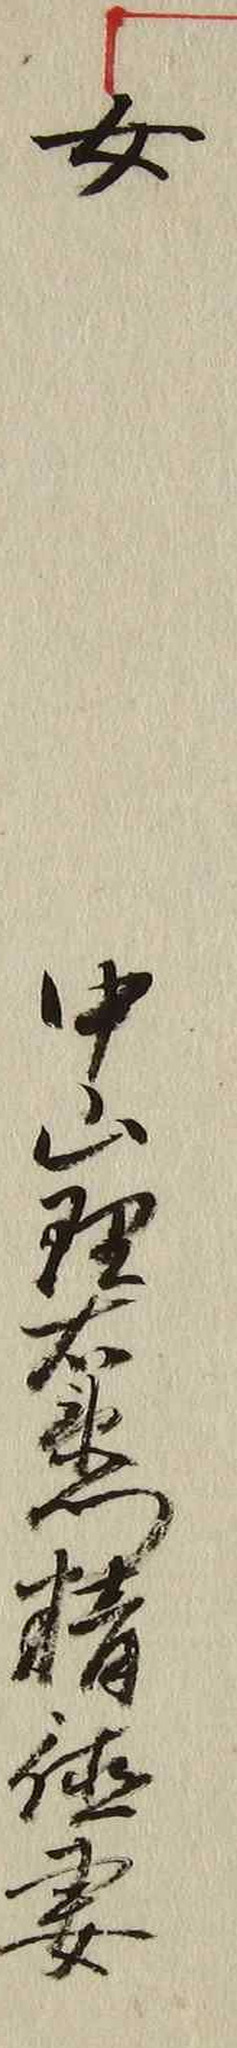女中山理右衛門精徳妻
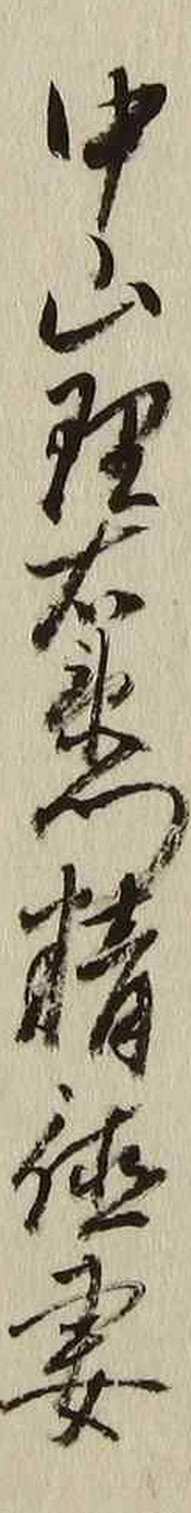女中山理右衛門精徳妻
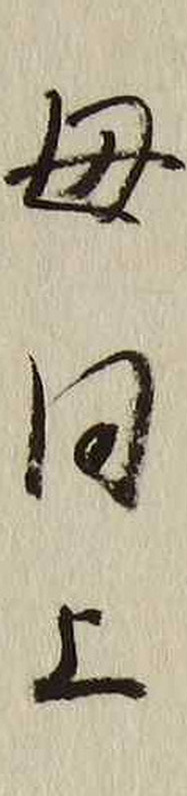母同上
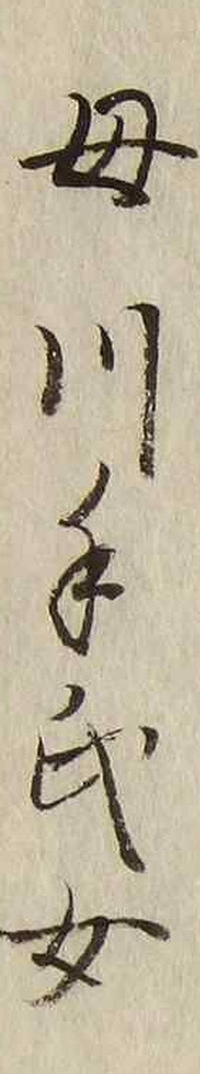母川手氏女
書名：諸士系譜　巻之348　も之部4
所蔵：会津若松市立会津図書館
